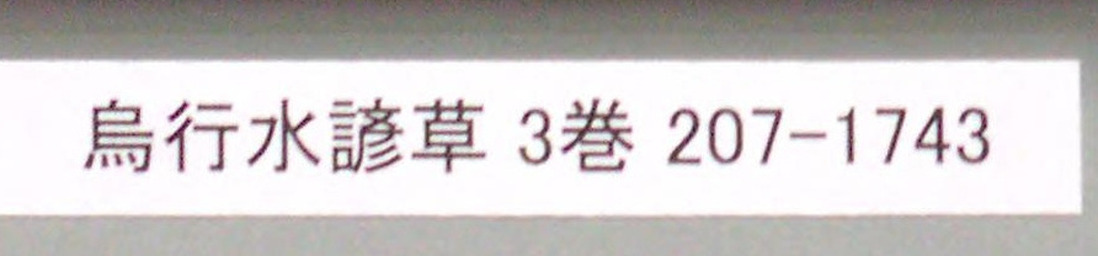烏行水諺草上
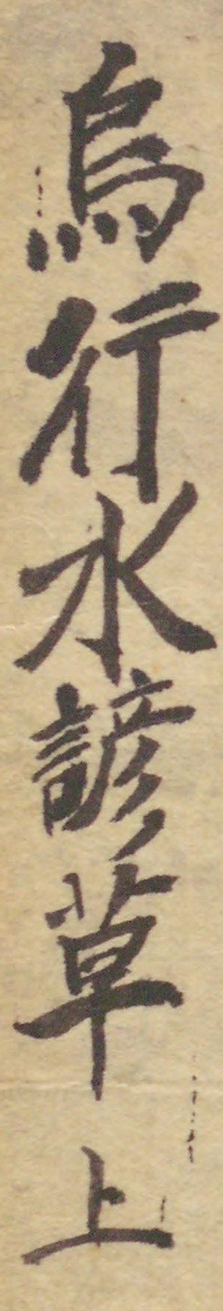烏行水諺草上

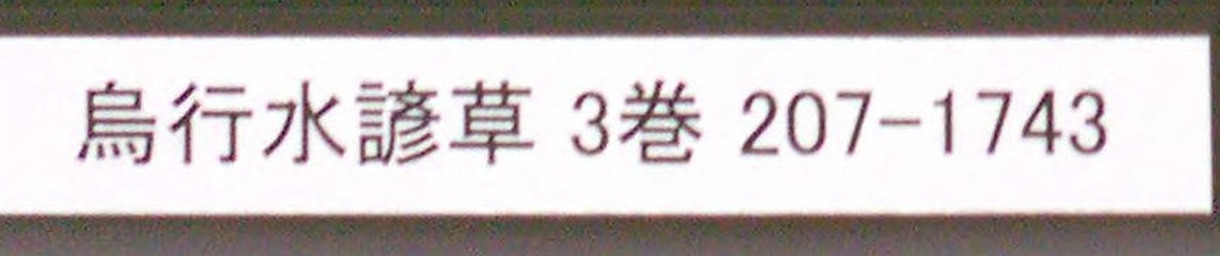烏行水諺草上

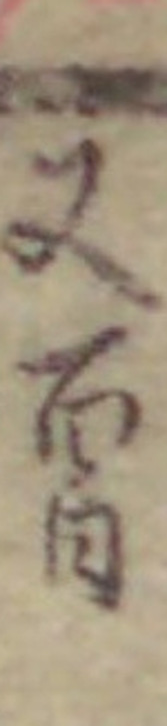又百日
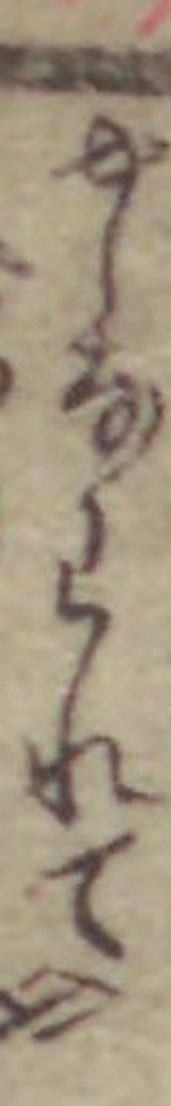やしなわれて
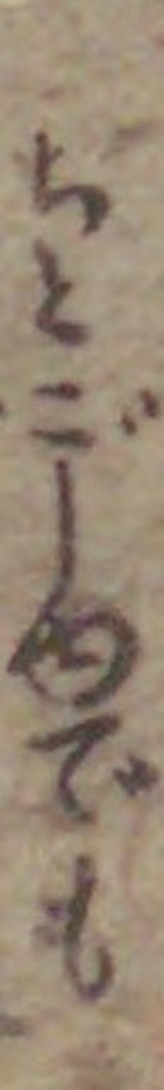ちとごしゆでも
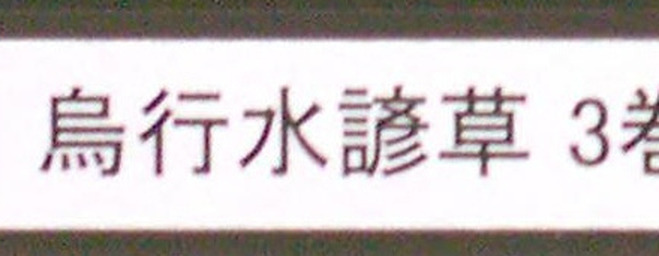烏行水諺草
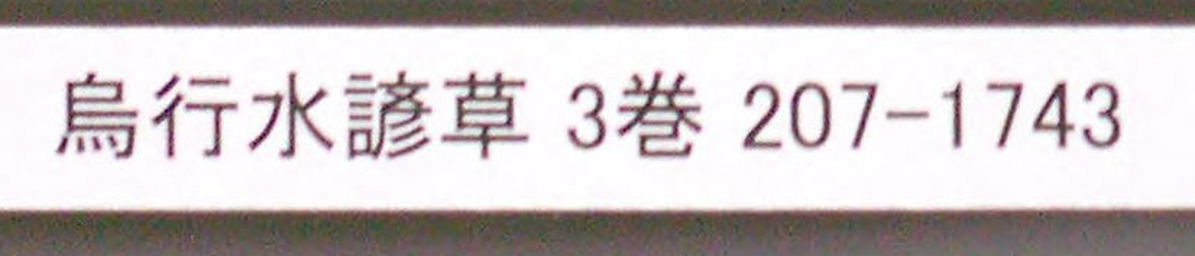烏行水諺草
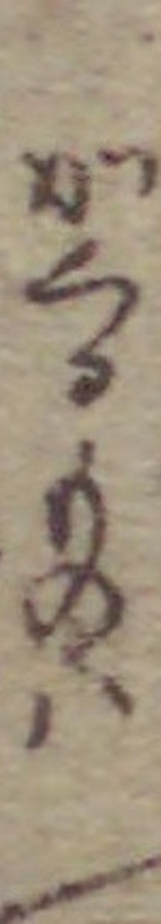かくるものハ
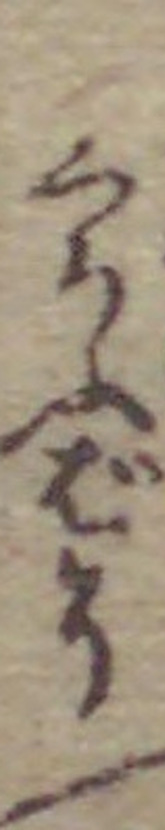くろふばかり
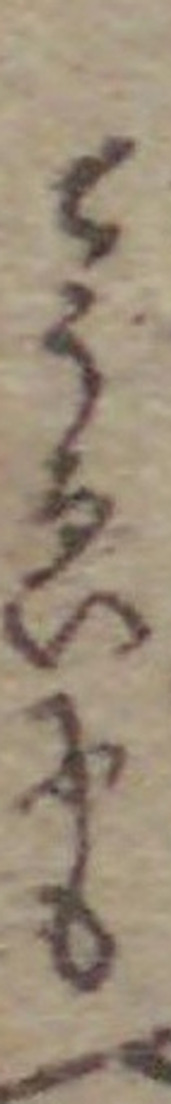てうるいにも
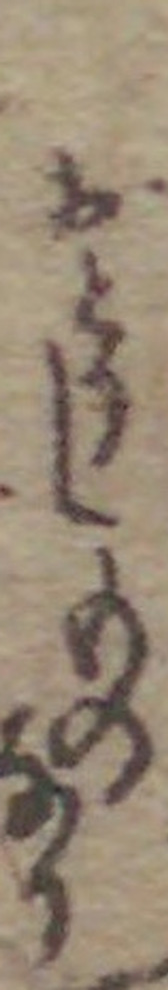おとりしものなり

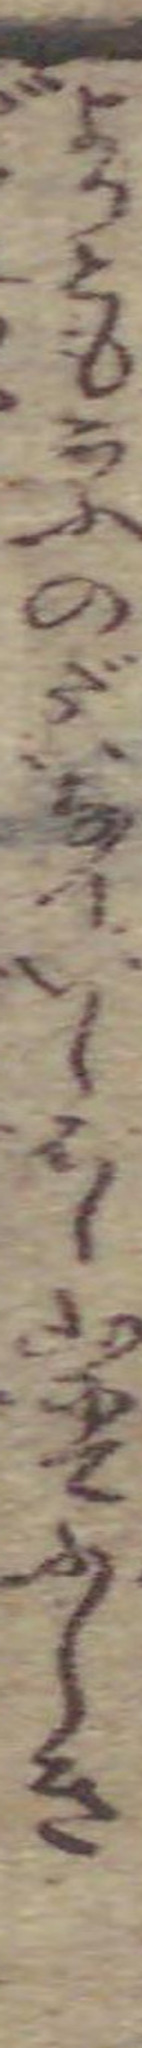よりともかふのだいなりいしばし山いてふしき
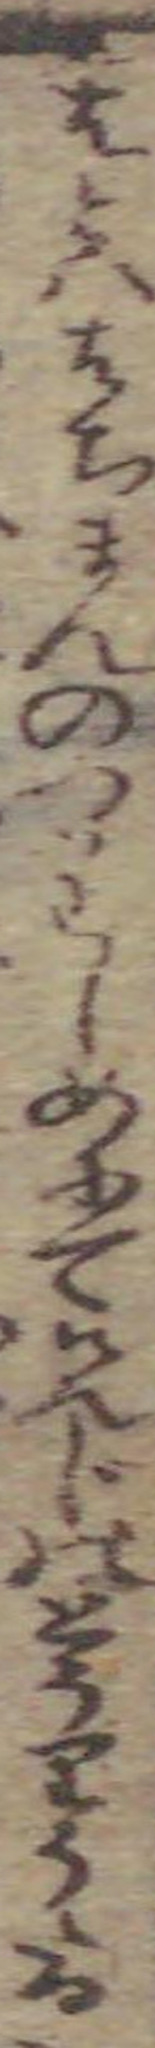はとハはちまんのつかわしめにてけんじのとうりうたる
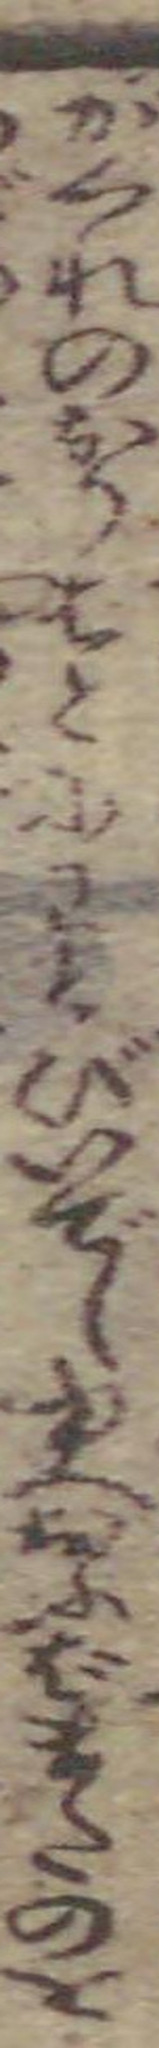がくれのおりはとにわとびいでしゆへおふばまたのを
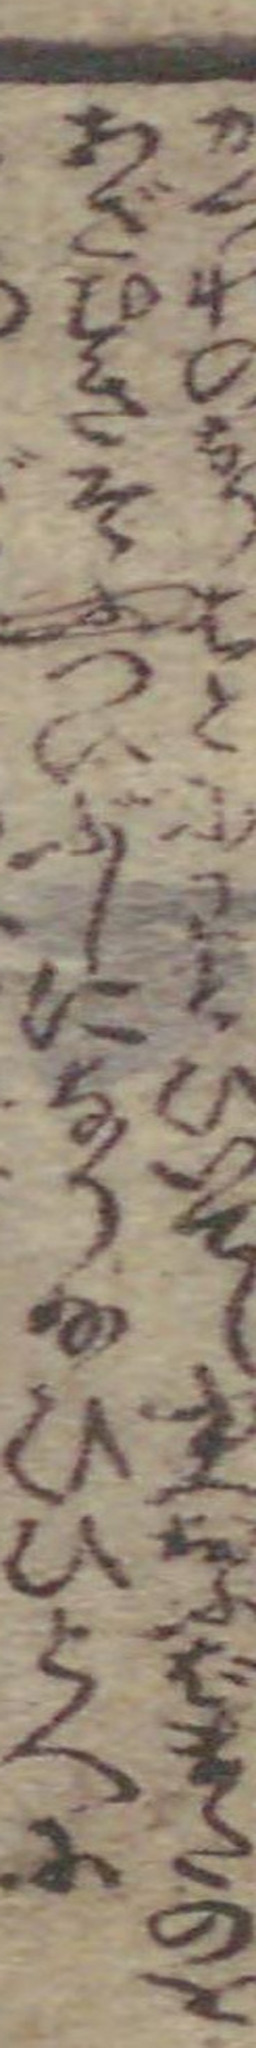あざむきそふついぶしになり給ひひとへに
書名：烏行水諺草 3巻
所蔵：国立国会図書館 National Diet Library, JAPAN
